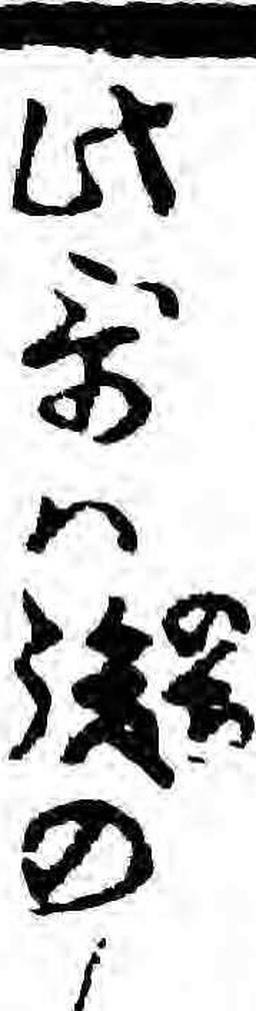此哥は後の
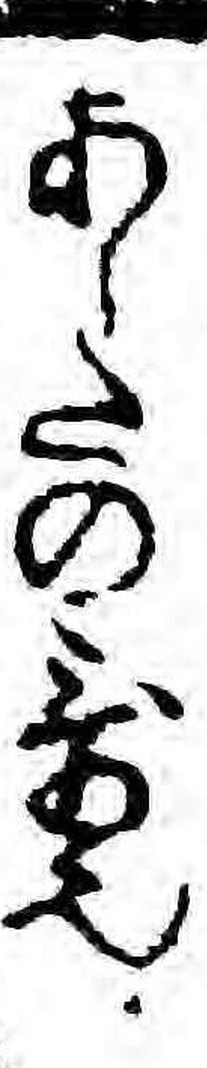あしたの哥也
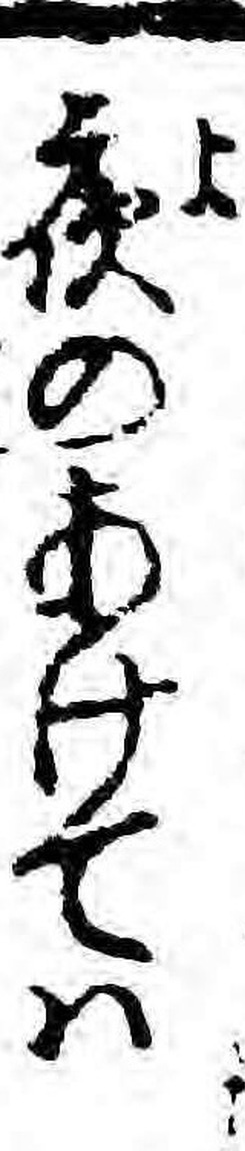夜のあけては
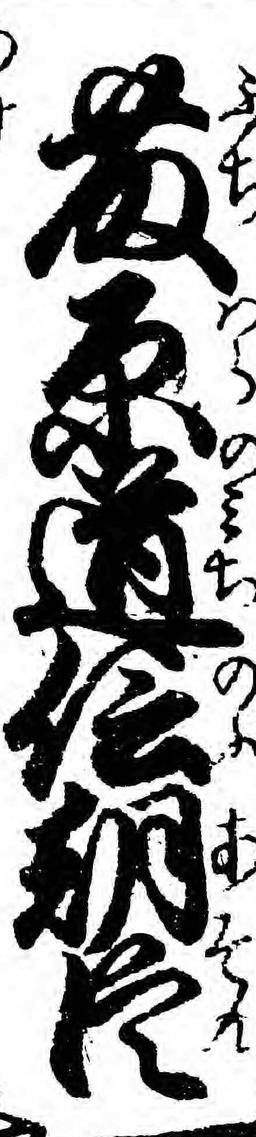藤原道信朝臣
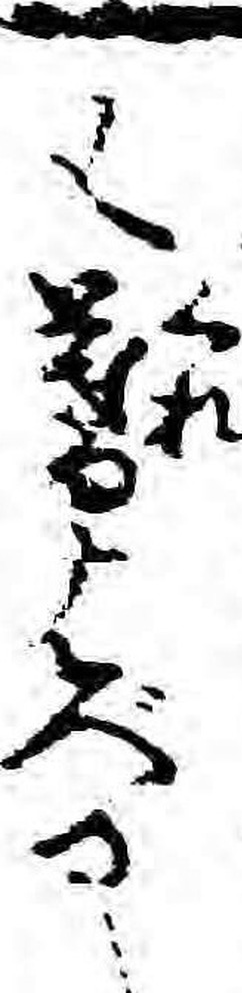又暮はべる
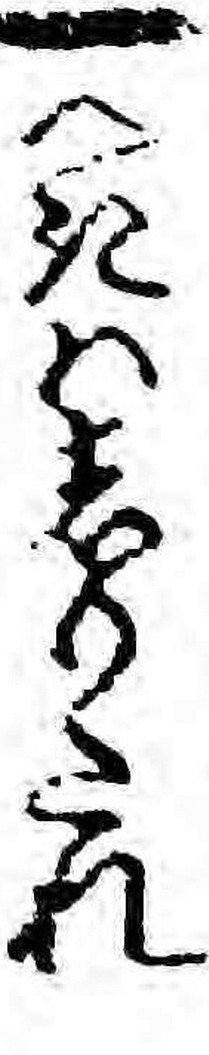べきはしりたれ
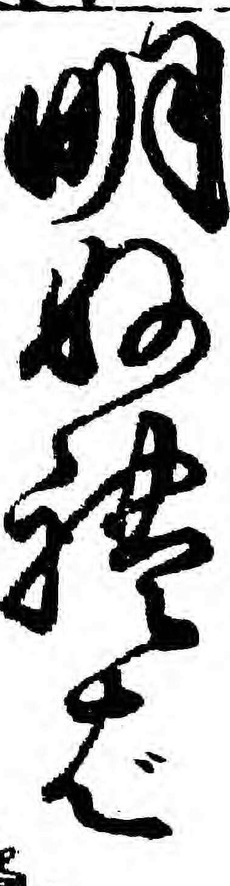明ぬれば
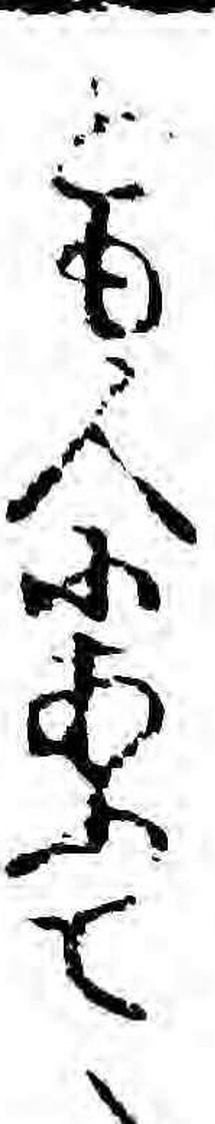ども人にあふて
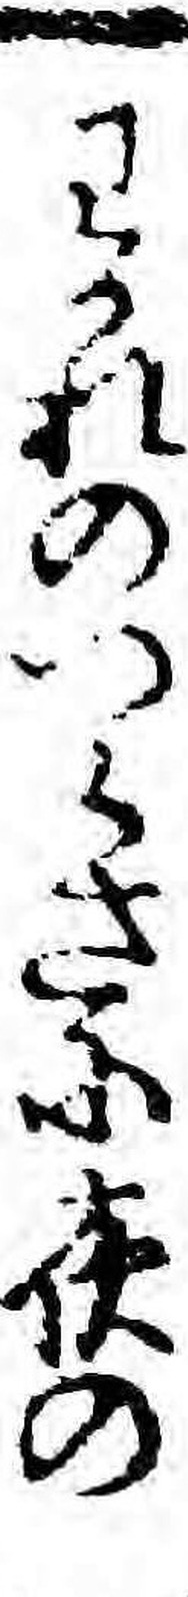わかれのつらさに夜の
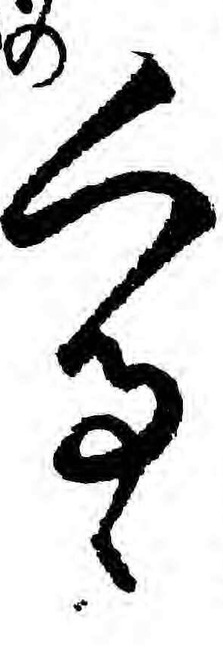くるゝ
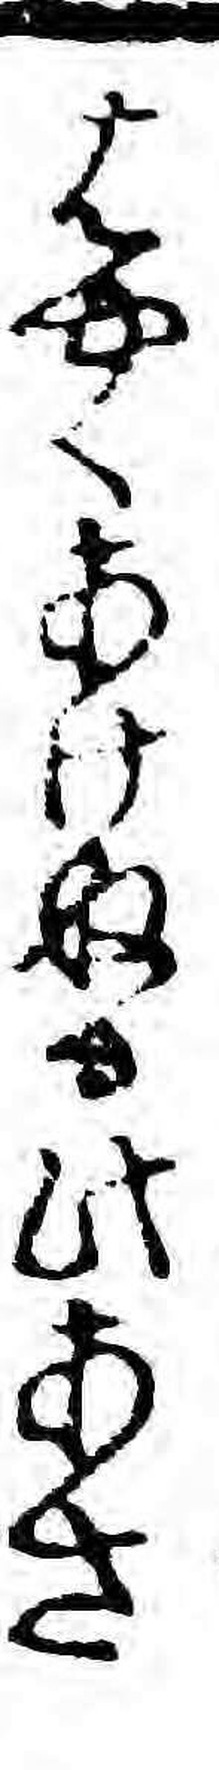はやくあけぬる此あさ
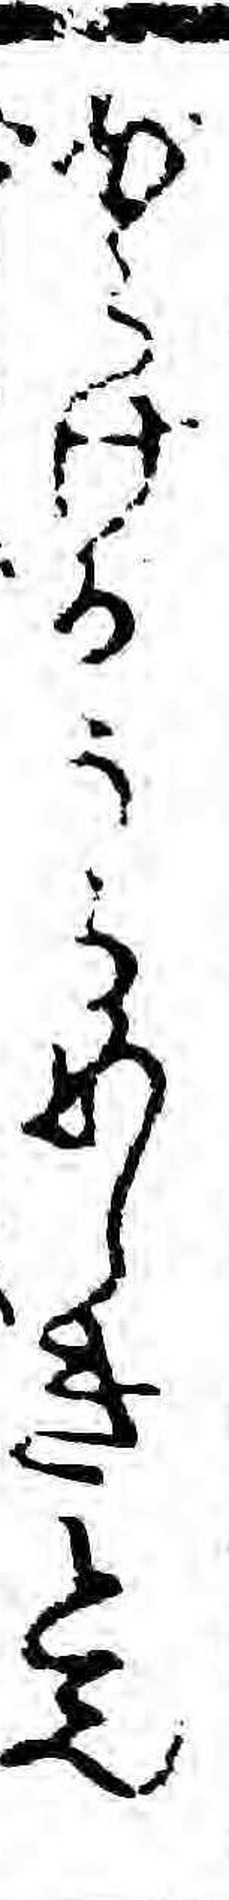ほらけかうらめしきと也
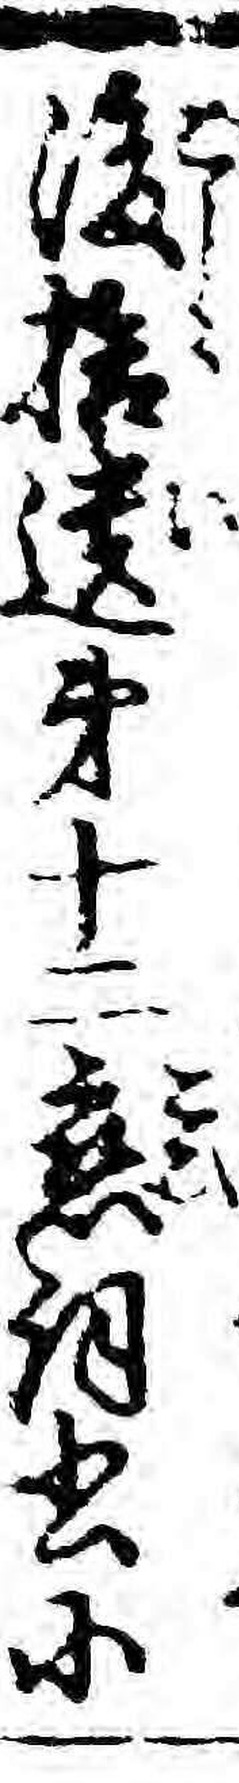後拾遺第十二恋詞書に
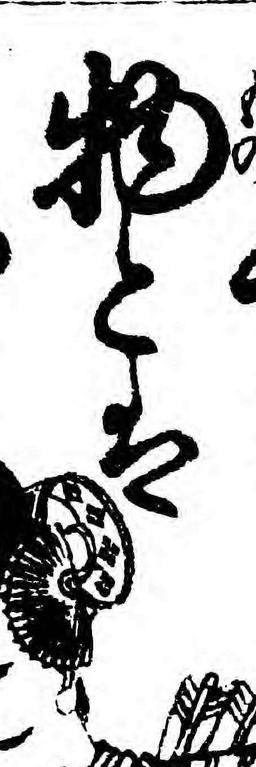物とは
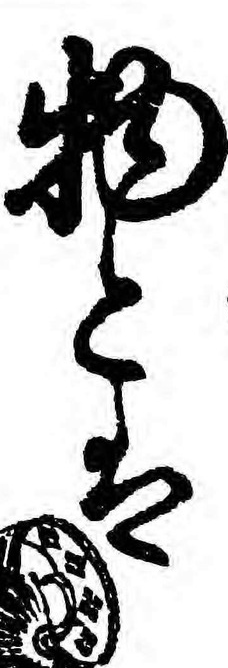物とは
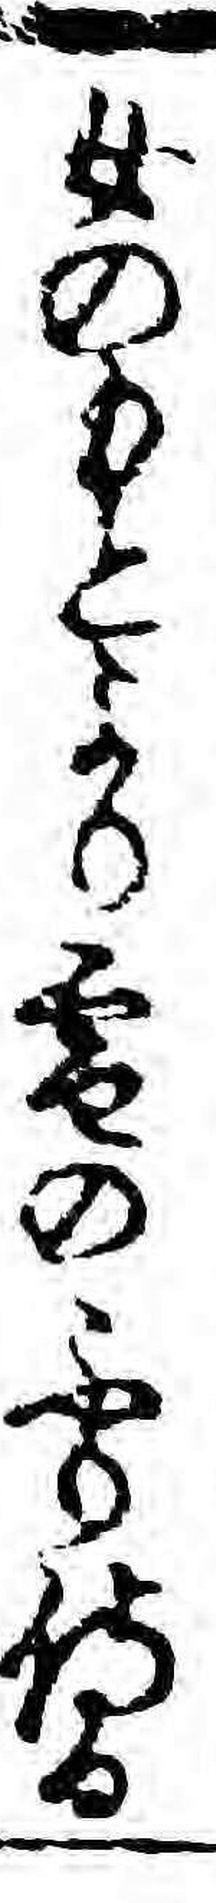女のもとより雪のふり侍る
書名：頭書和歌注譯／壽賀多百人一首小倉錦
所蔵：国文学研究資料館
